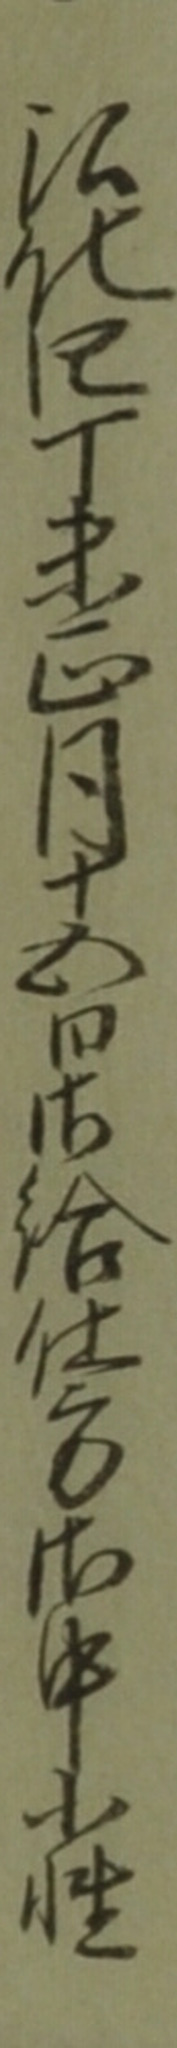一弘化四丁未正月十五日御給仕方御中小性
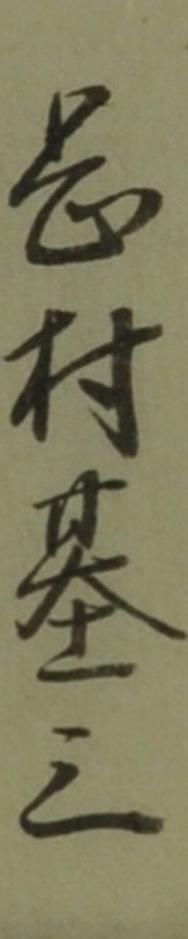岡村基三

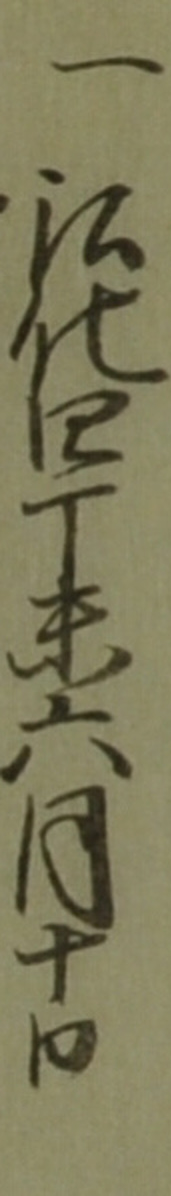一弘化四丁未六月十日
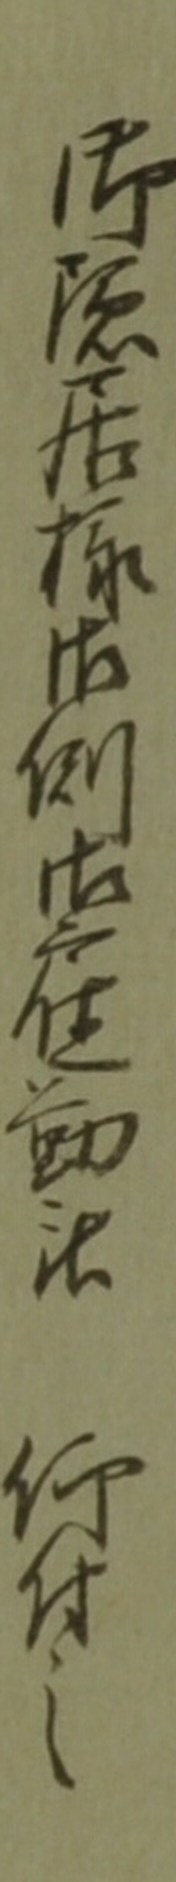御隠居様御側御雇勤被仰付之
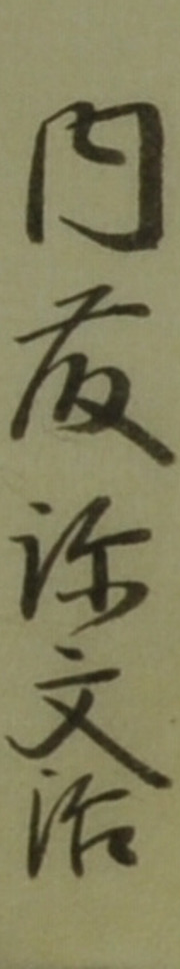内藤弥文治
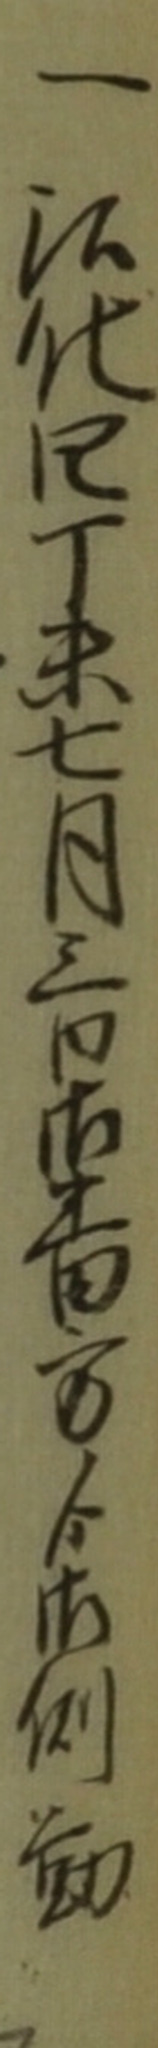一弘化四丁未七月三日御番方ゟ御側勤
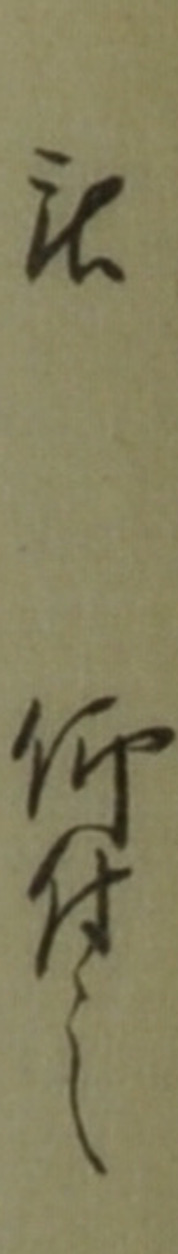被仰付之
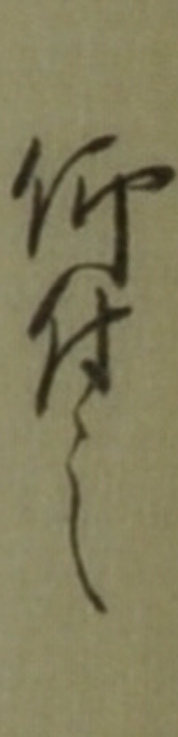仰付之
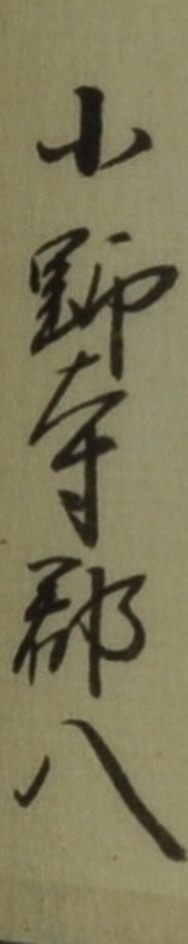小野寺郡八
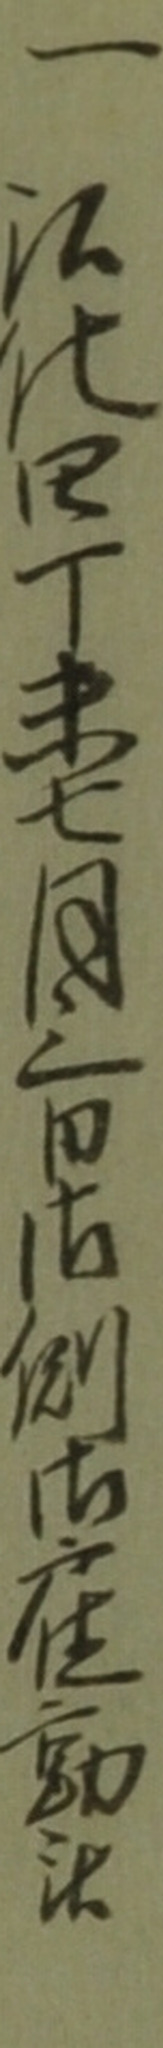一弘化四丁未七月三日御側御雇勤被
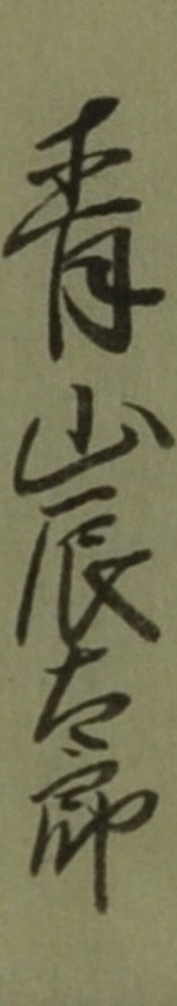青山辰太郎
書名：諸御役代々録（五）
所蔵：伊那市立高遠町図書館・合同会社AMANE
